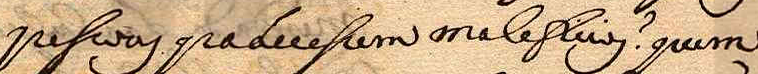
pessoas padecessem maleficios? quem
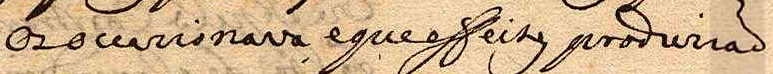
os occazionava, e que effeitos produziaõ?
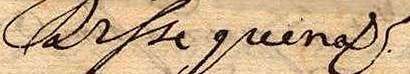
Disse, que naõ.
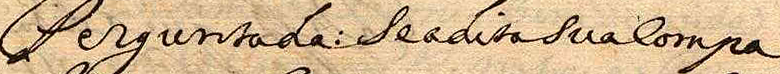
Perguntada: se a dita sua compa
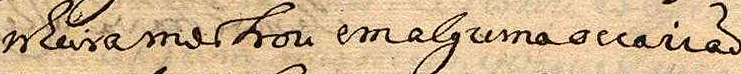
nheira mostrou em alguma occaziaõ
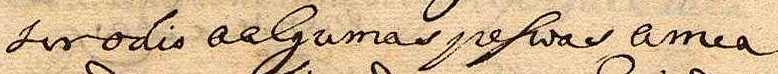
ter odio a algumas pessoas amea
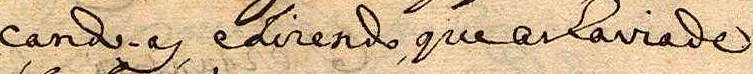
çando-as, e dizendo, que as havia de
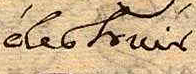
destruir?
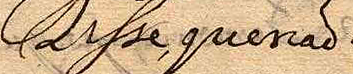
Disse, que naõ.
